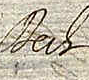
DecL
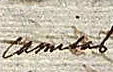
camisas
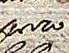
porco
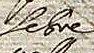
Lebre
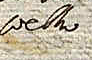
coelho
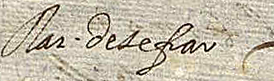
Raz. de se fiar
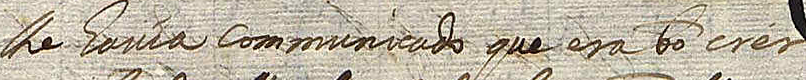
lhe hauia communicado que era bō crer
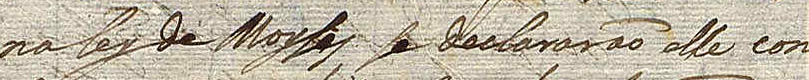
na ley de Moyses se declararão elle con
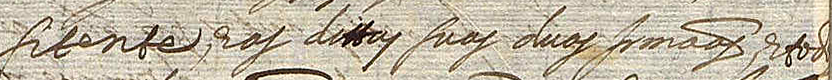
fitente, E as dittas suas duas Jrmaãs, e tod_
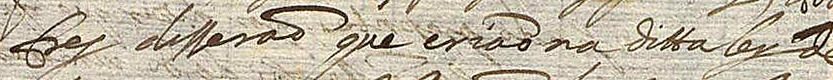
tres disseraõ que crião na ditta ley de
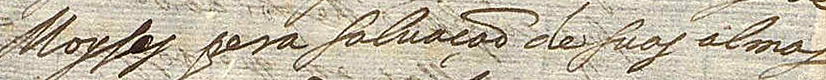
Moyses pera saluaçaõ de suas almas
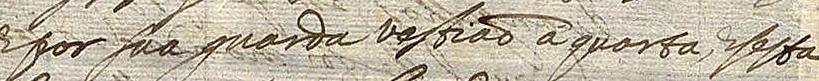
E por sua guarda vestiaõ á quarta, E sesta
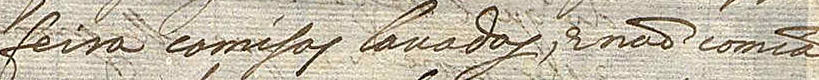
feira camisas lauadas, E não comiaõ
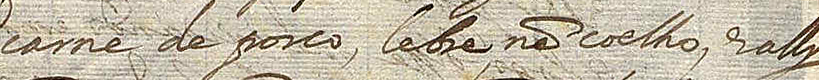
carne de porco, lebre, nē coelho, E ally
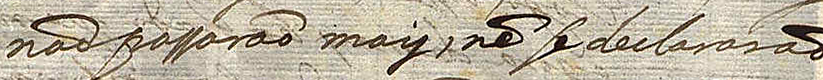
naõ passarão mais, nē se declararaõ
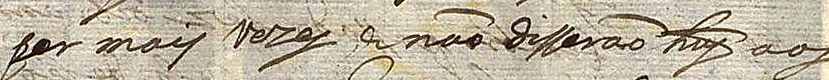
per mais vezes, E não disserão hūs aos
